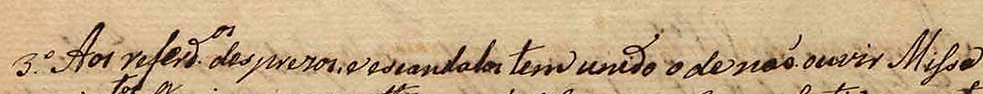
3.o Aos referd.os desprezos, e escandalos tem unido o de naõ ouvir Missa
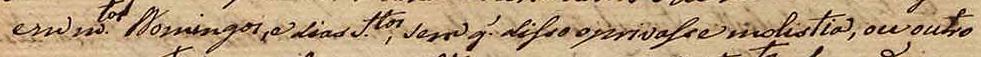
em m.tos Domingos, e dias S.tos, sem q̄ disso o privasse molestia, ou outro
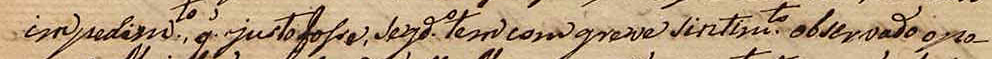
impedim.to, q̄ justo fosse, segd.o tem com greve sintim.to observado o po
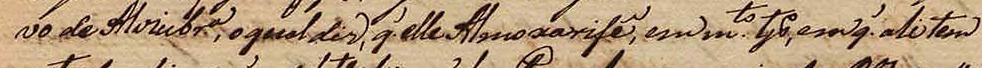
vo de Alviubr.a, o qual diz, q̄ elle Almoxarifee, em m.to tpo, em q̄ ali tem
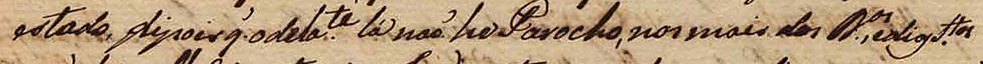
estado, dipois q̄ o dela.te lá naõ he Parocho, nos mais dos D.os, e dias s.tos
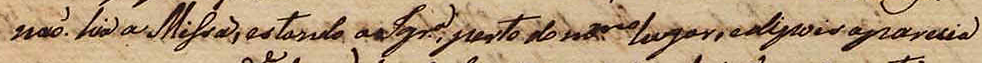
naõ hia a Missa, estando a Igr.a perto do m.mo lugar, e dipois aparecia
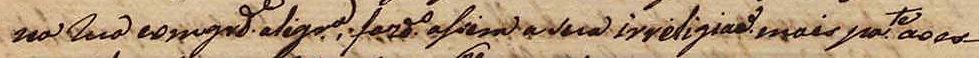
na Rua com grd.e aligr.a; fazd.o assim a sua irreligiaõ mais pa.te ao es
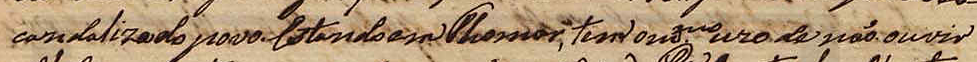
candalizado povo. Estando em Thomar, tem o m.mo uzo de naõ ouvir
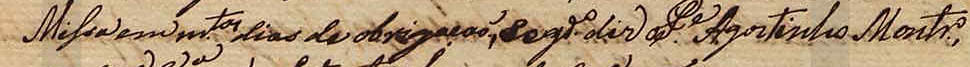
Missa em m.tos dias de obrigaçaõ, segd.o diz o P.e Agostinho Montr.o,
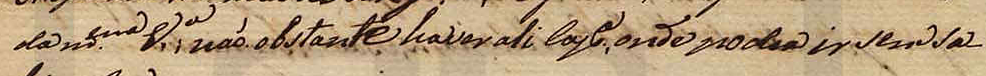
da m.ma V.a: naõ obstante haver ali Capa., onde podia ir sem sa
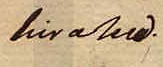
hir a Rua.
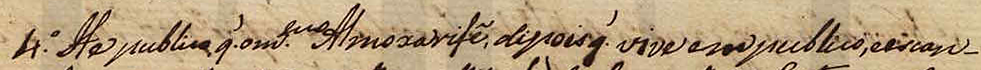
4.o He publico, q̄ o m.mo Almoxarifê, depois q̄ vive em publico, e escan
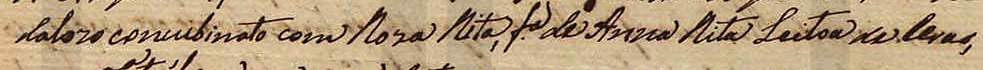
dalozo concubinato com Roza Rita, f.a de Anna Rita Leitoa da Ceras,
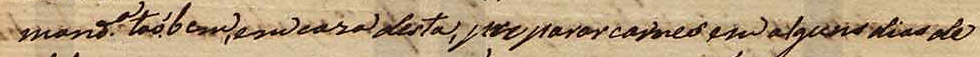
mand.a taõbem, em caza desta, preparar carne em alguns dias de
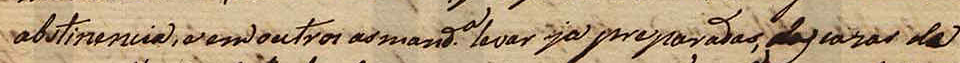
abstinencia, e em outros as mand.a levar ja preparadas, das cazas da
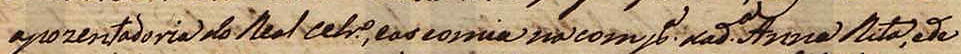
apozentadoria do Real celr.o, e as comia na comp.a da d.a Anna Rita, e de
